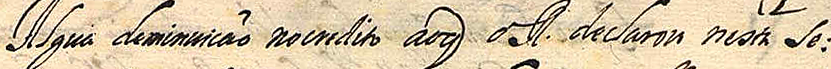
Algua deminuicaõ no credito ao q̄ o R. declarou nesta Se
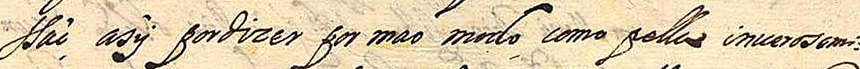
ssaõ, asy por dizer por mao modo, como pella inuerosemi
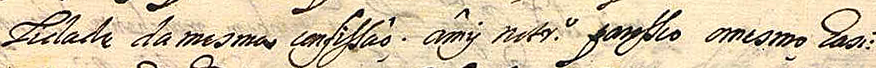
Lidade da mesma confissaõ; a my notr.o paresseo o mesmo, E asi
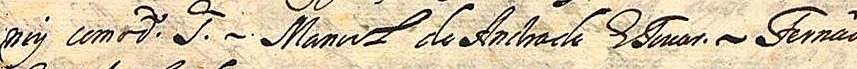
ney com o d̄o. Sor.~. Manoel de Andrade E Touar. ~ Fernaõ
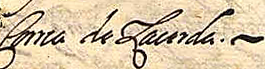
Correa de Lacerda. ~
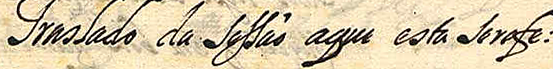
Traslado da Sessaõ a que esta se refe
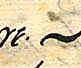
re. ~
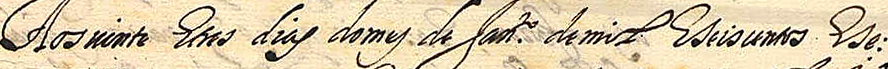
Aos uinte E tres dias do mes de Jan.ro de miL E seiscentos E se
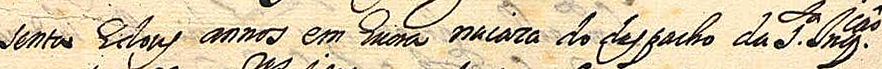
senta E dous annos em Euora na caza do despacho da Sta. Inqcaõ.
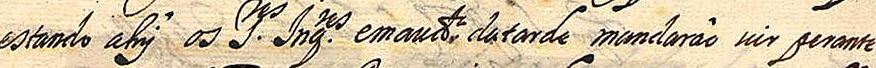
estando ahy os Sres. Inqres. em aud̄a. da tarde mandaraõ uir perante
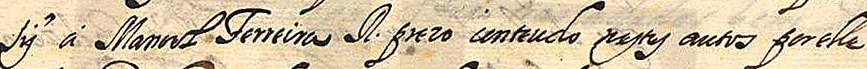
Sy a Manoel Ferreira R. prezo conteudo nestes autos por elle
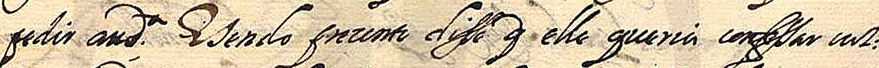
pedir aud̄a; E sendo prezente disse q̄ elle queria confessar cul
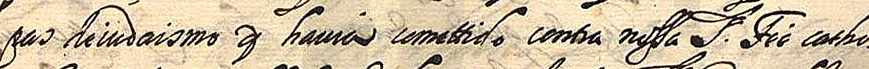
pas de iudaismo q̄ hauia comettido contra nossa Sta. Feé catho
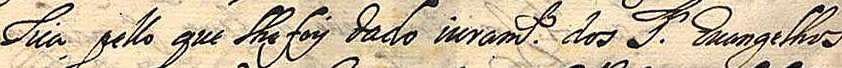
Lica, pello que lhe foy dado iuram.to dos Stos. Euangelhos
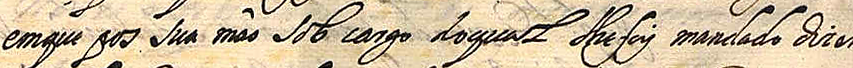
em que pos sua mão sob cargo do quaL lhe foy mandado dizer
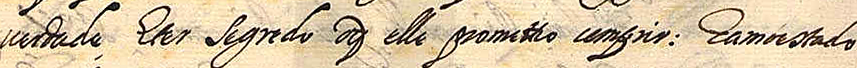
uerdade, E ter Segredo o q̄ elle prometteo cumprir: E amoestado
